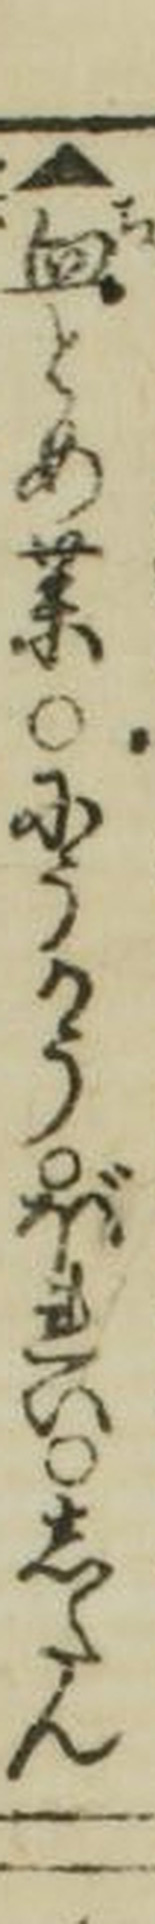▲血とめ薬○にうかう◯ぼれい◯したん
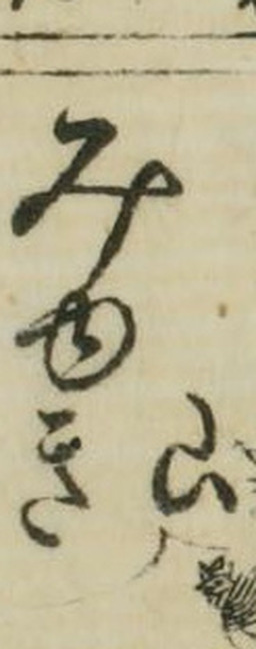みゆき
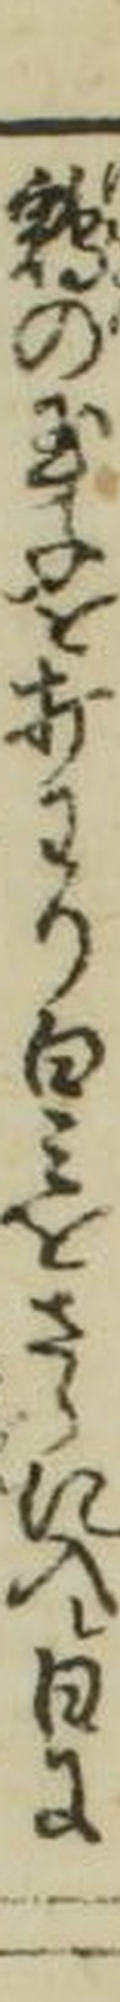鶏の玉子を打わり白みをさらに入れ日に
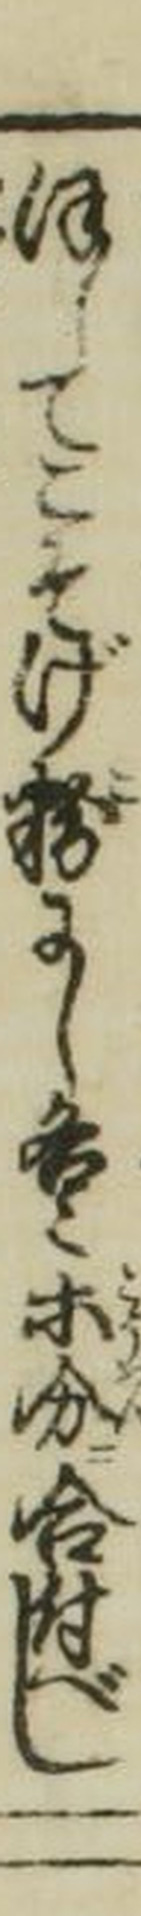ほしてこそげ粉にし各々等分に合付べし
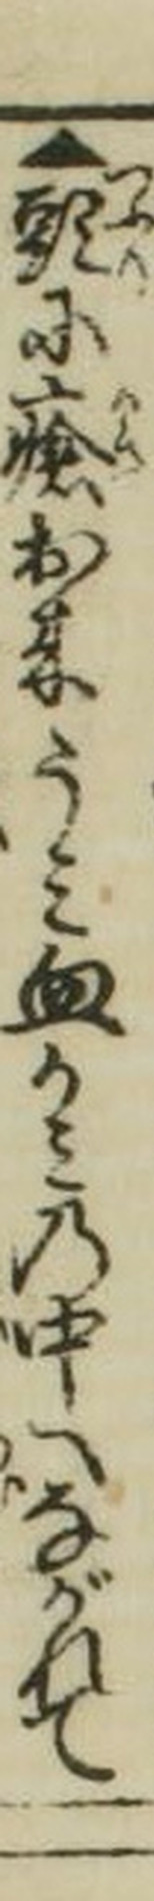▲頭に瘡出来うみ血かみの中へながれて
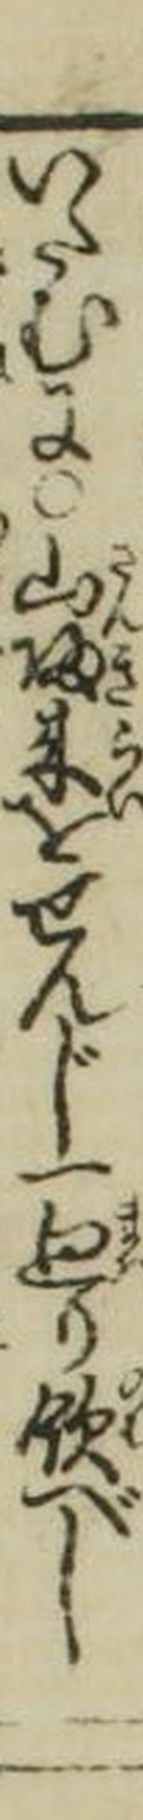いたむに◯山帰来をせんじ一廻り飲べし
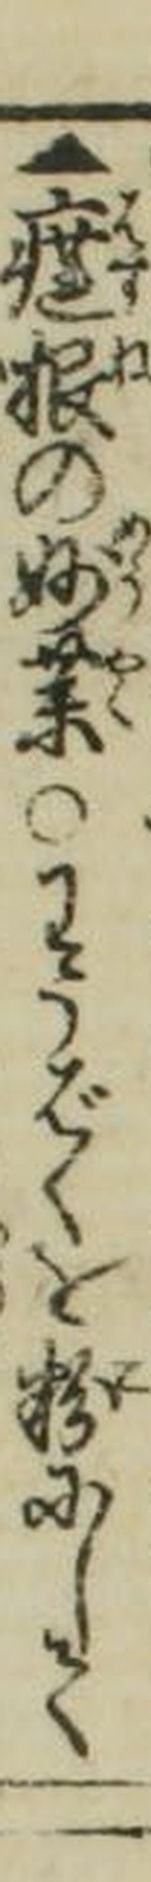▲根の妙薬◯わうばくを粉にして
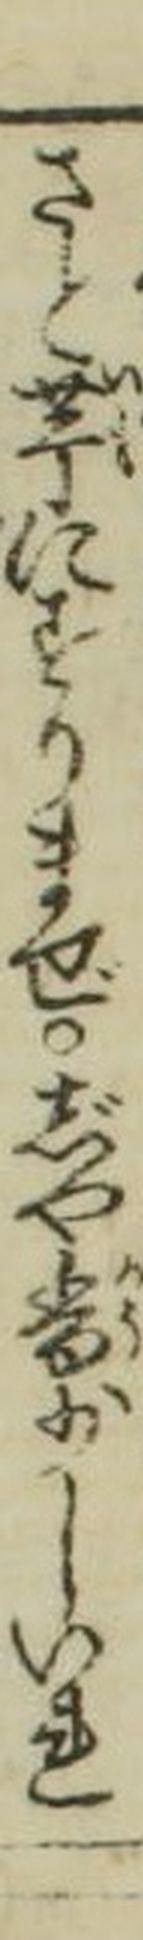さと芋にすりまぜ◯じや香少しいれ
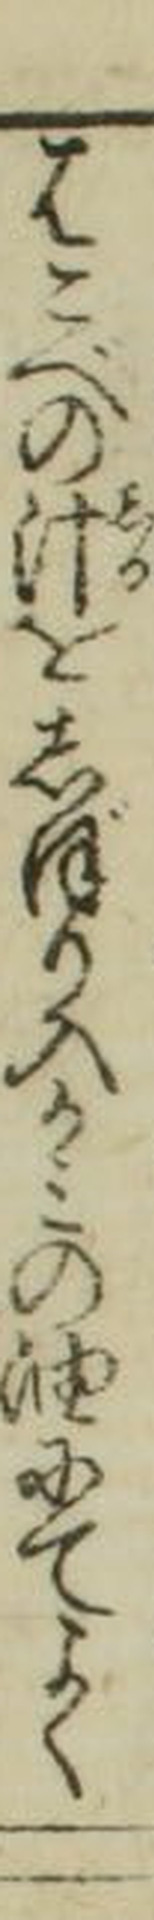はこべの汁をしぼり入かみの油にてよく
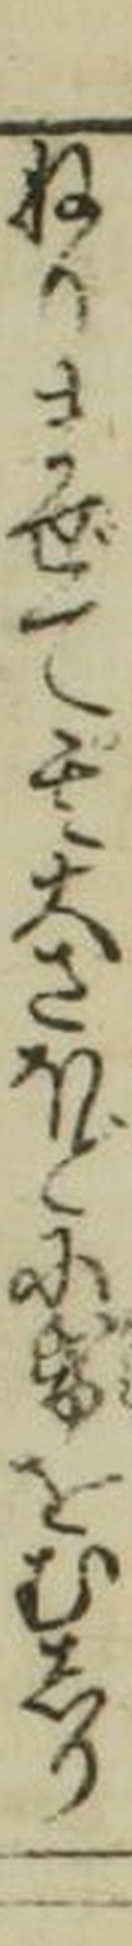ねりまぜて。其大さほどに紙をむしり
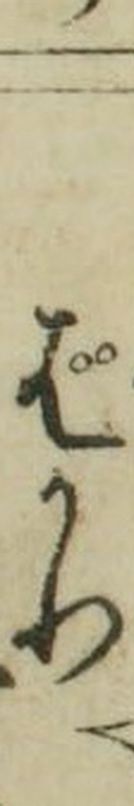ばかり
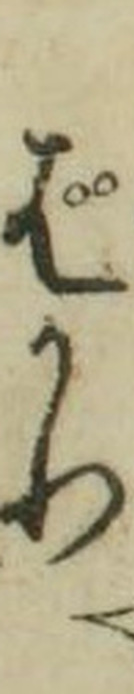ばかり
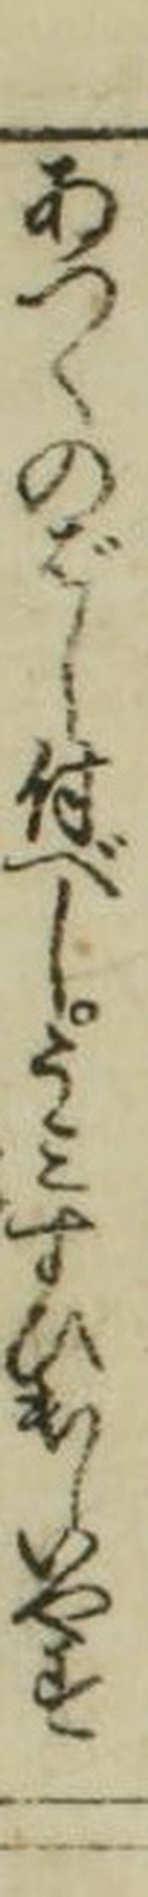あつくのばし付べし。うみすひ出しいやす
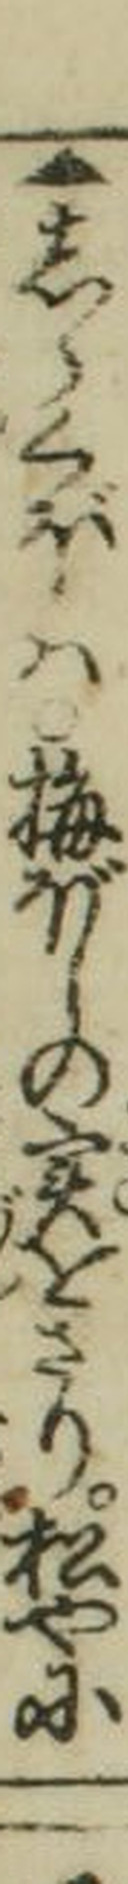▲しらくぼは○梅ぼしの実をさり。松やに
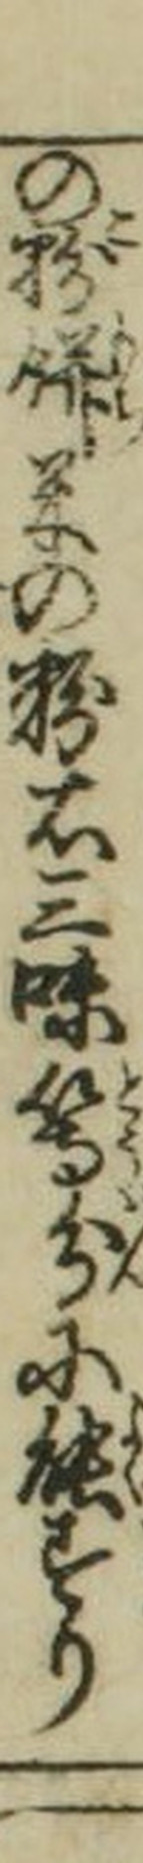の粉餅米の粉右三味等分に能すり
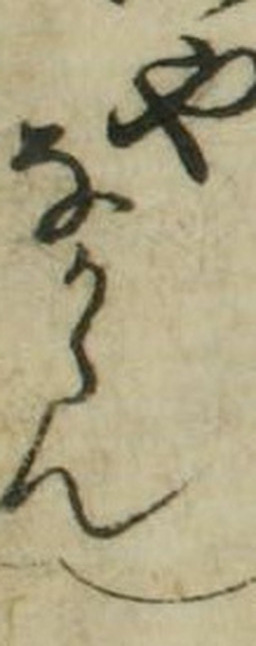なからん
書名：女源氏教訓鑑
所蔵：東京学芸大学附属図書館
